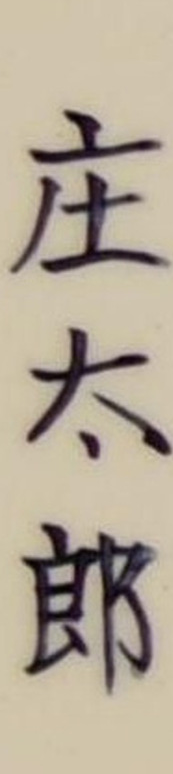庄太郎

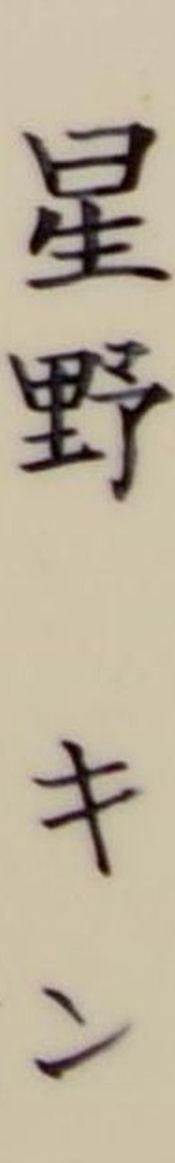星野キン
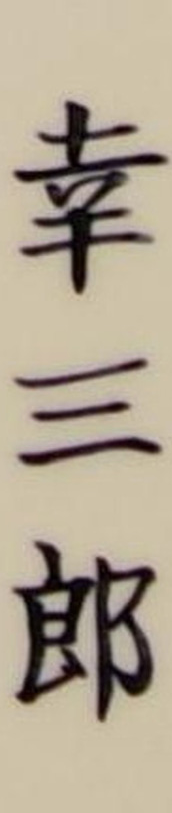幸三郎
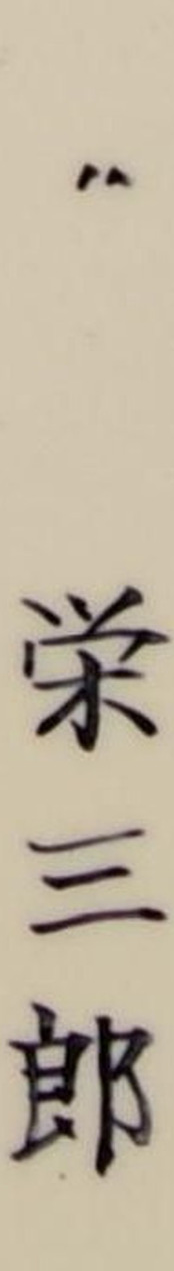栄三郎
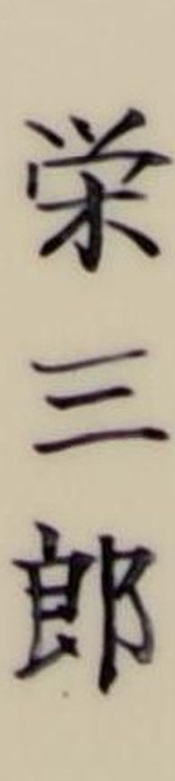栄三郎
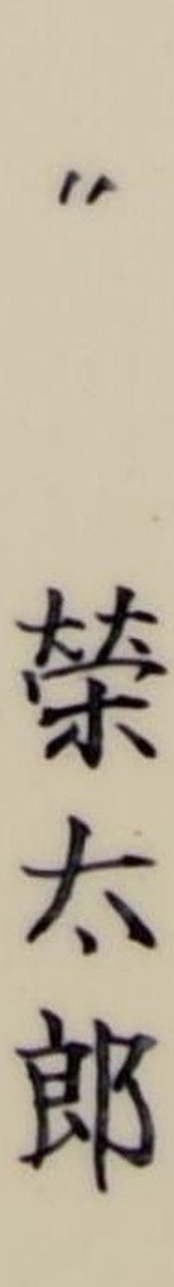榮太郎
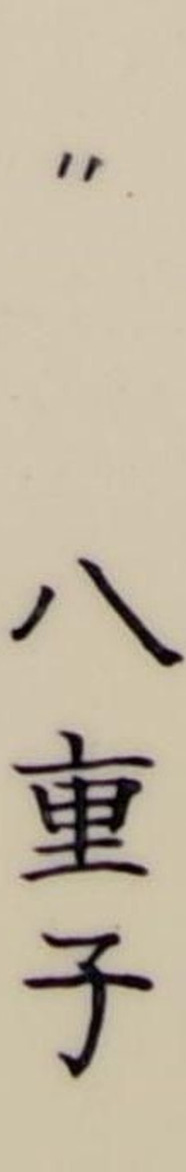八重子
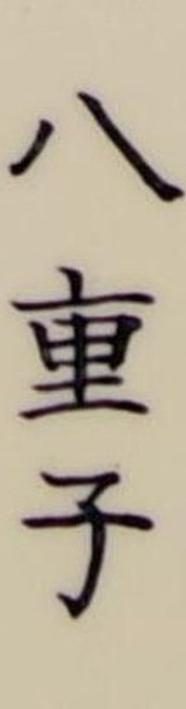八重子
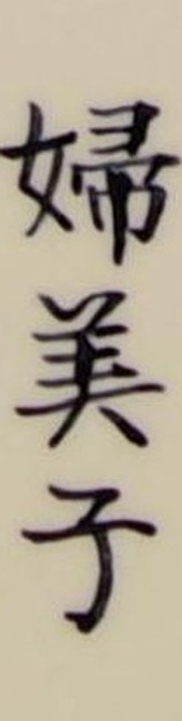婦美子
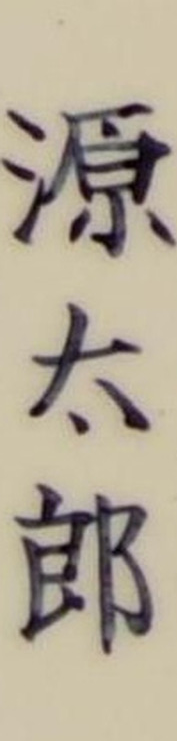源太郎

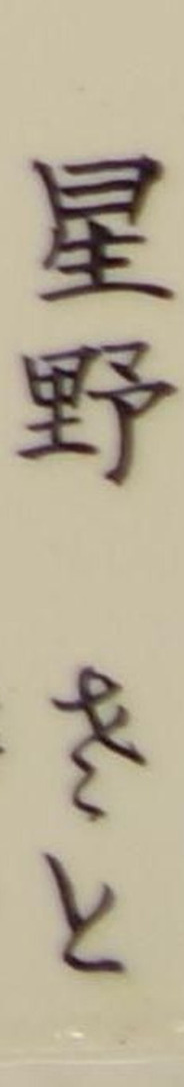星野さと
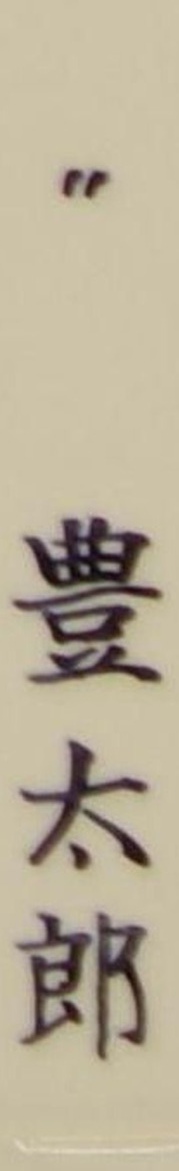豊太郎
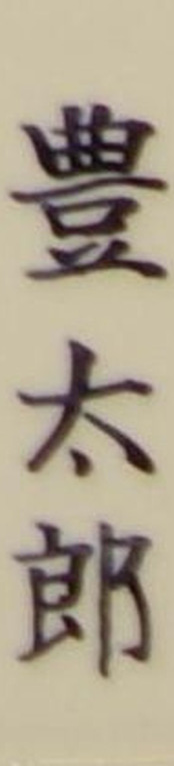豊太郎
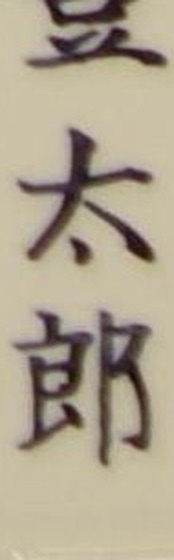豊太郎
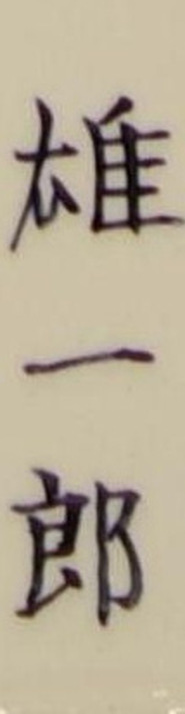雄一郎
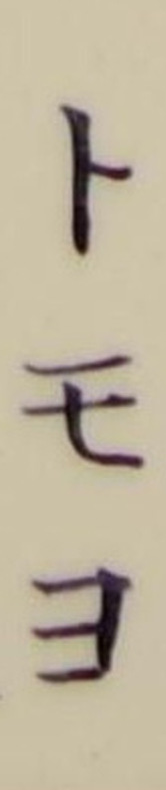トモヨ
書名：A~D
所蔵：koyasan kongobuji
